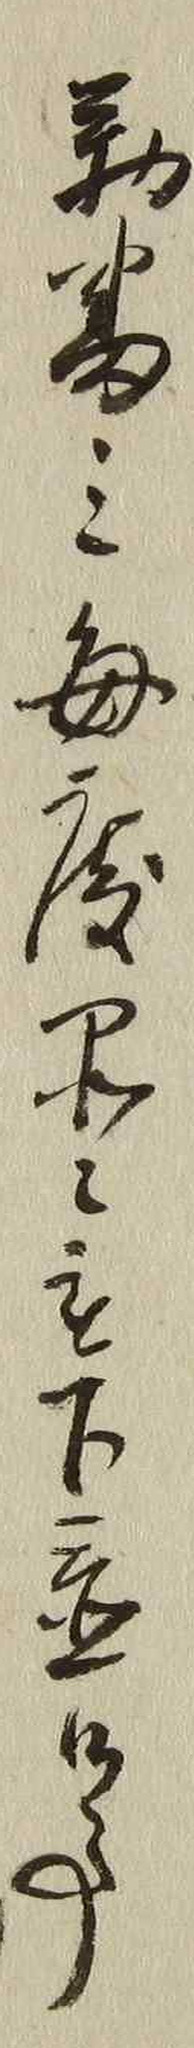勤番之毎度品々被下置候事
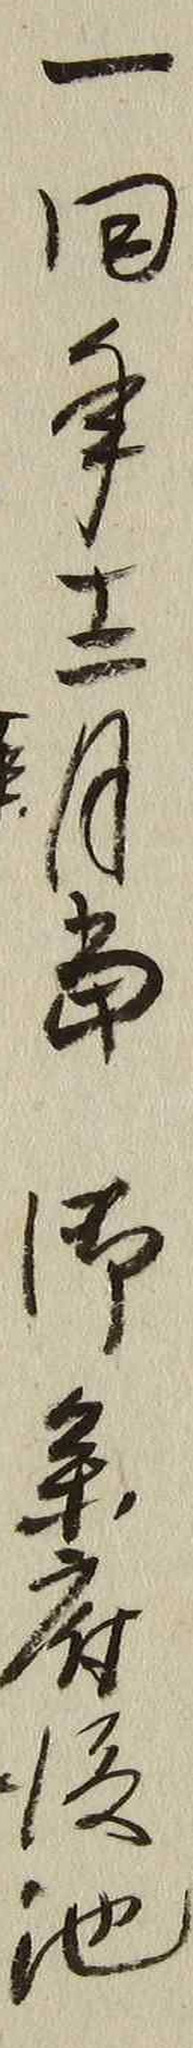一同年十二月当御参府後池
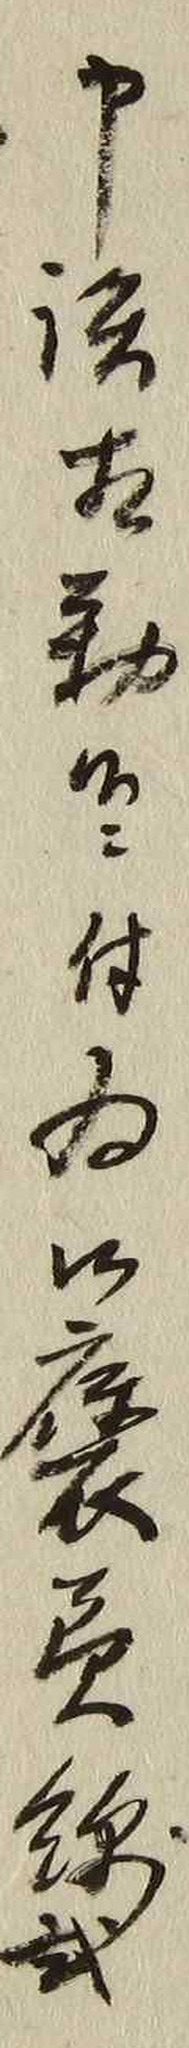申談相勤候ニ付為御褒美綿弐
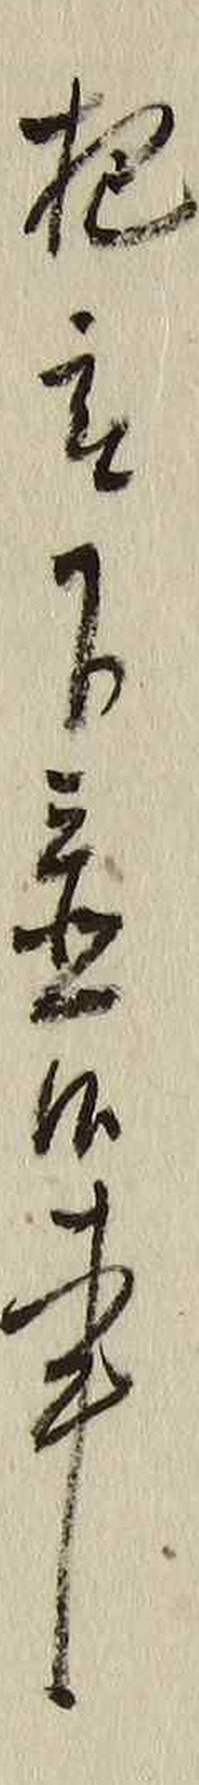把被下置候事
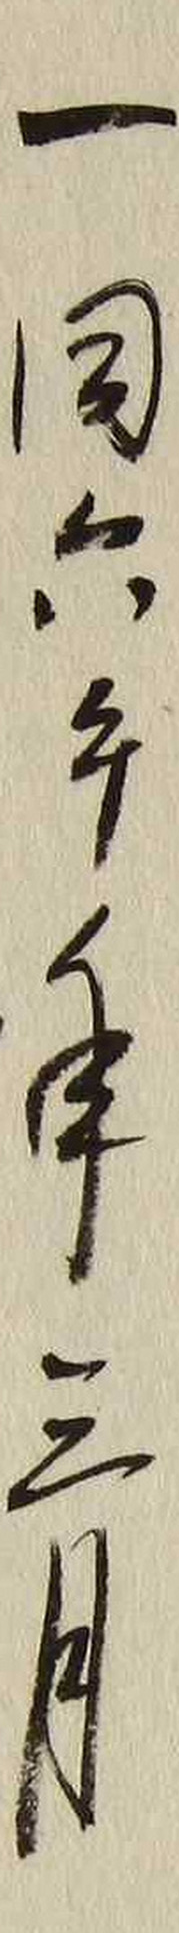一同六午年三月
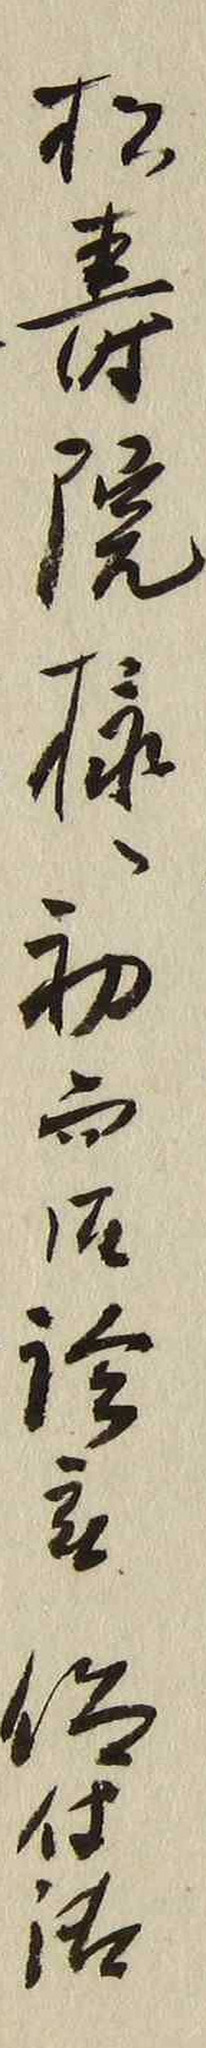松寿院様へ初而御診被仰付御
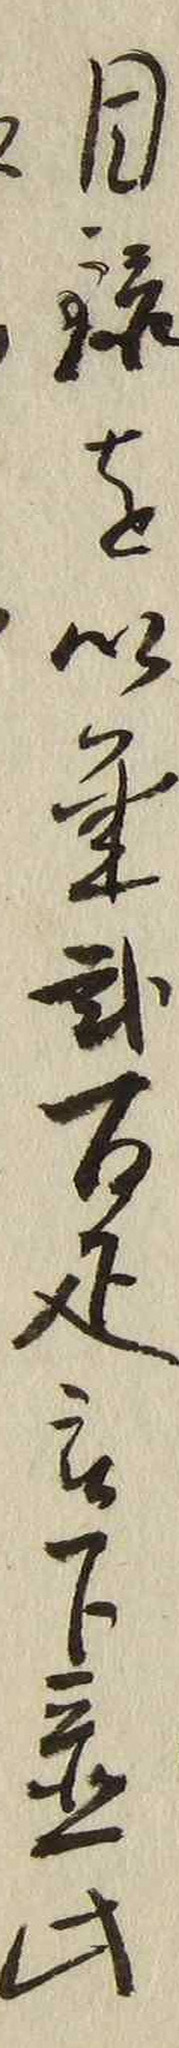目録を以金弐百疋被下置此
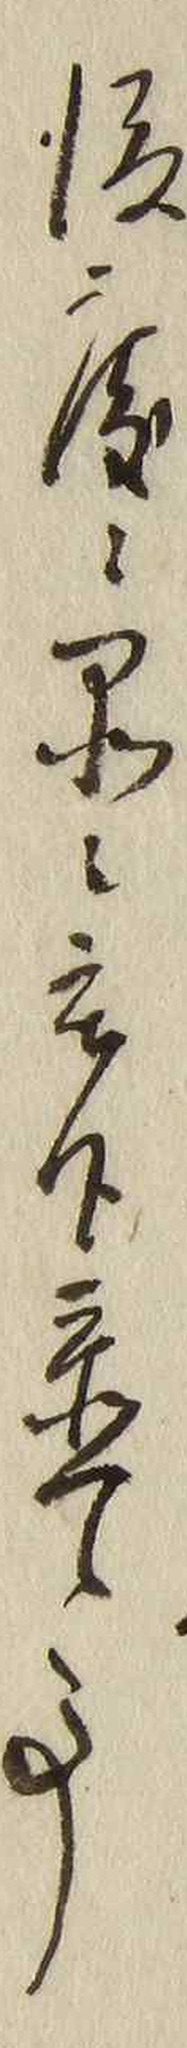後度々品々被下置候事

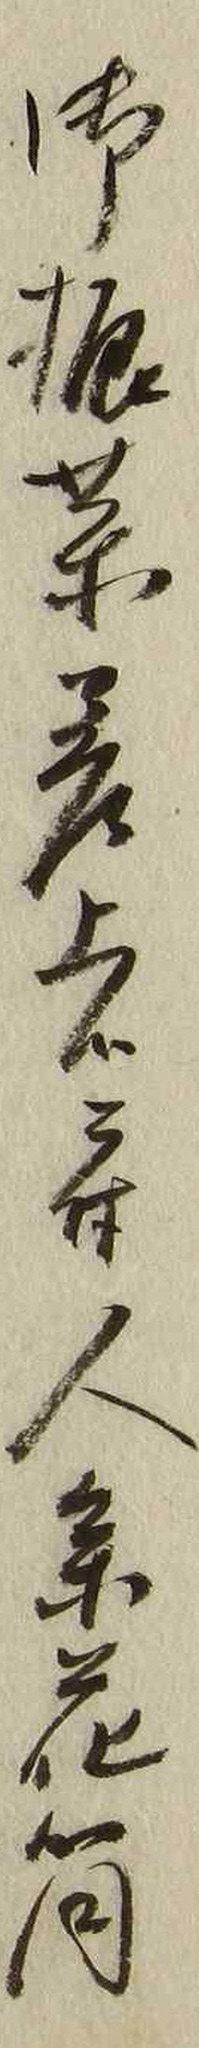御振薬差上候ニ付人参花筒
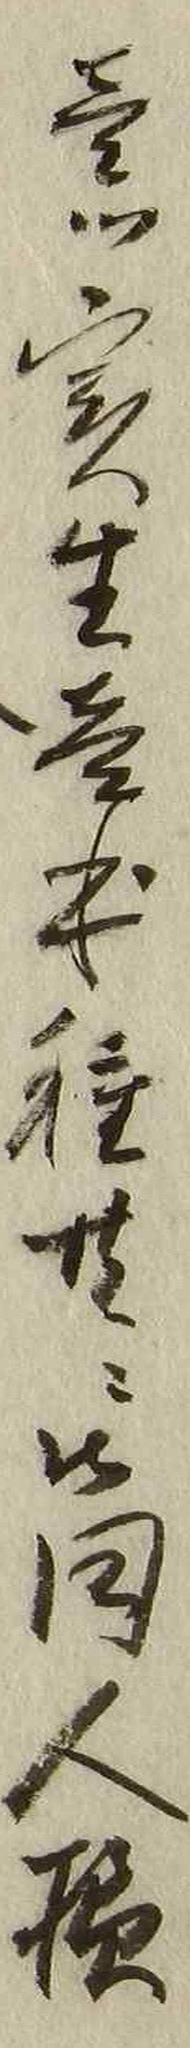壱ツ実生壱本種共ニ御同人様
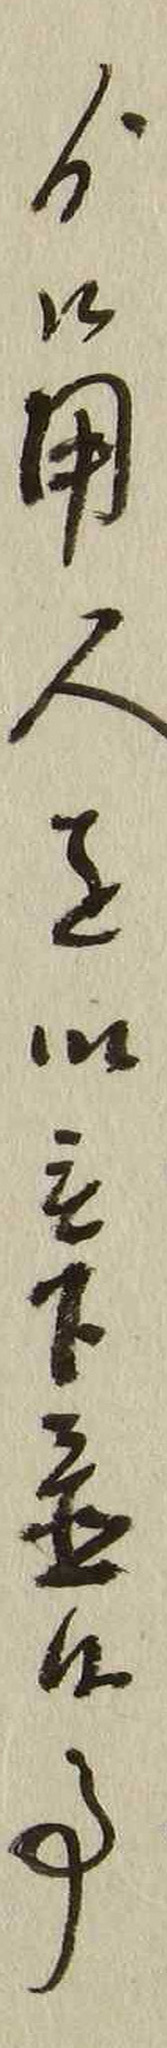ゟ御用人を以被下置候事
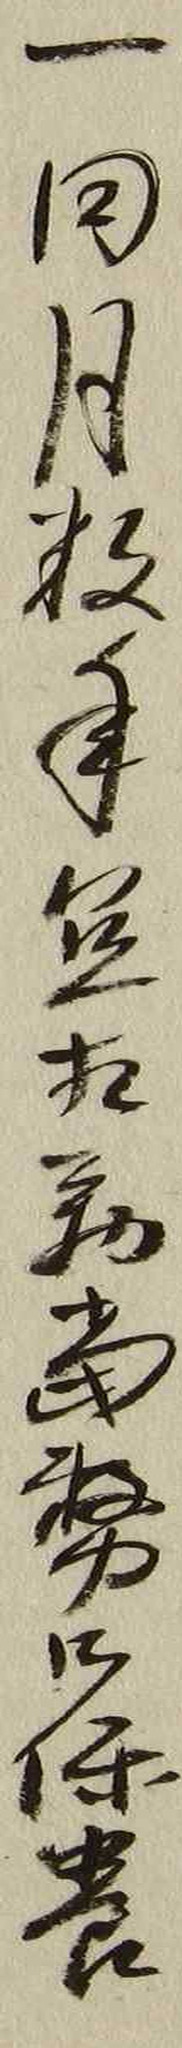一同月数年宜相勤当務御保養
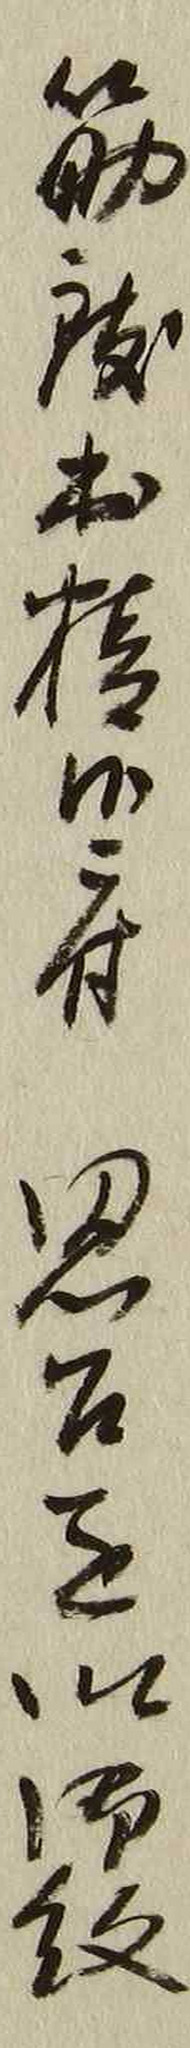筋致出精候ニ付思召を以御紋
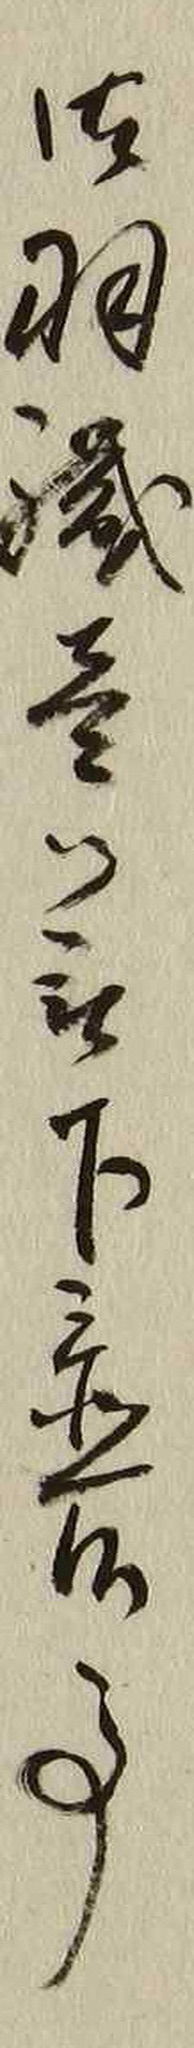御羽織壱ツ被下置候事
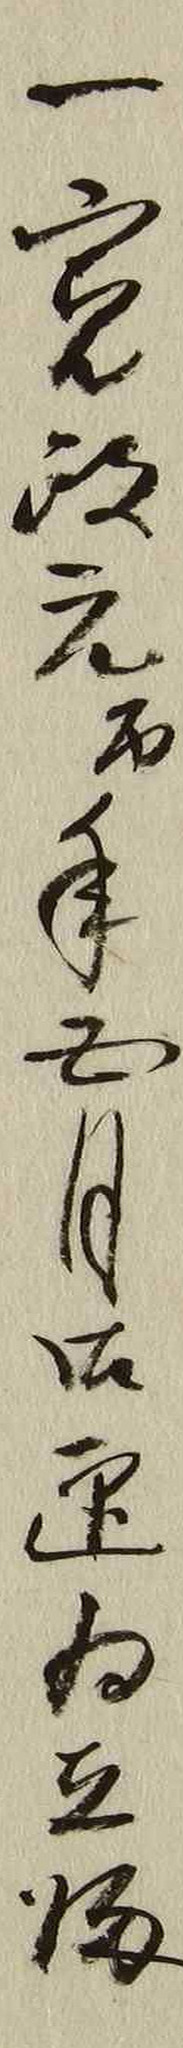一寛政元酉年五月御迎為立帰
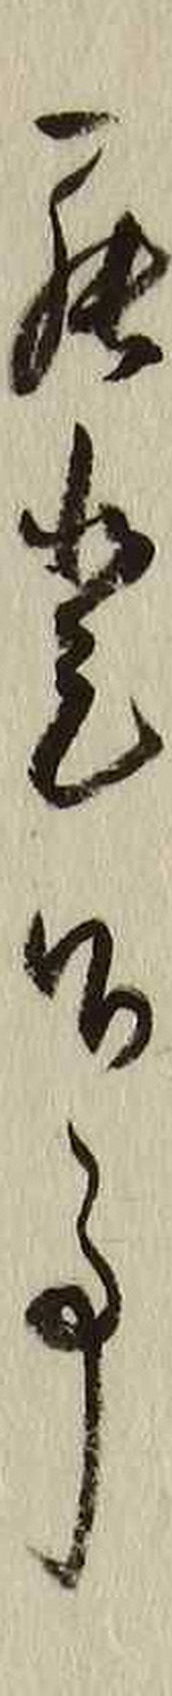罷登候事
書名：諸士系譜　巻之353　す之部3
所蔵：会津若松市立会津図書館
